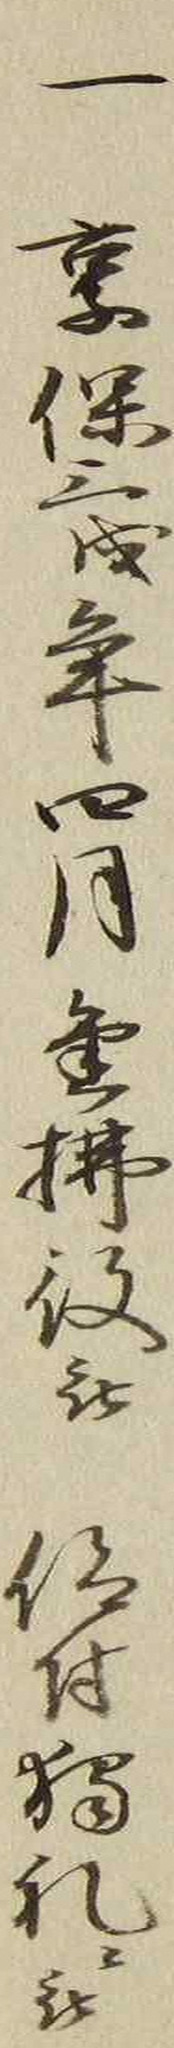一享保三戌年四月金払役被仰付独礼ニ被
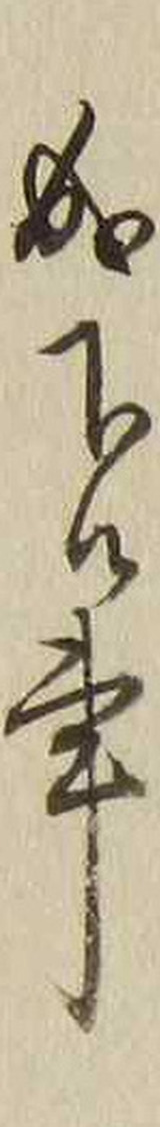成下候事
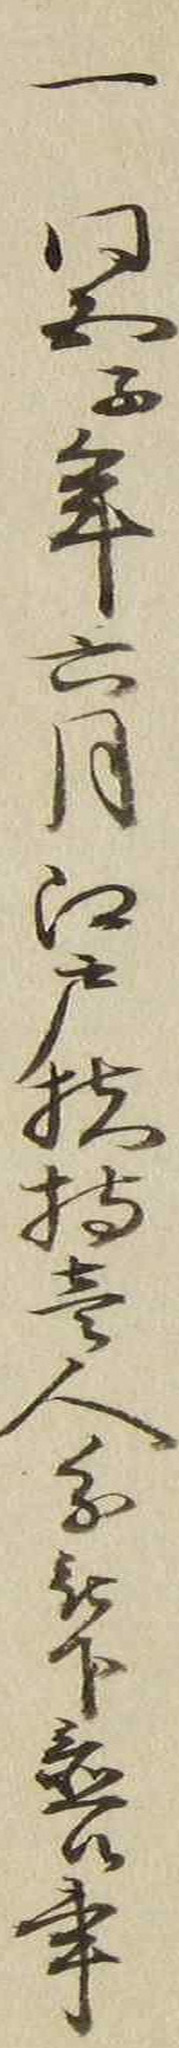一同五子年六月江戸扶持壱人分被下置候事
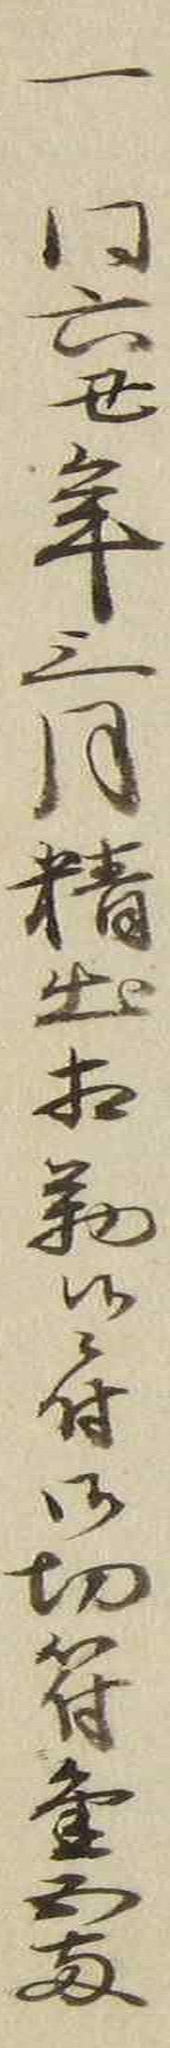一同六丑年三月精出相勤候ニ付御切符金五両

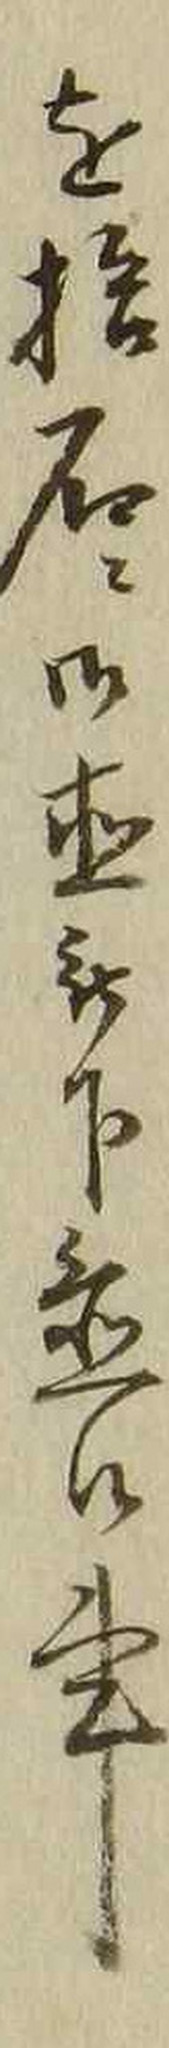を拾石ニ御直被下置候事
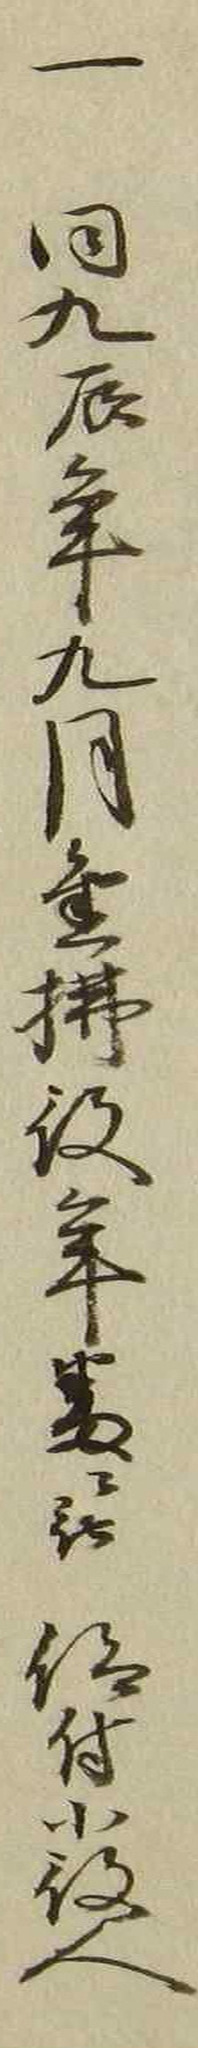一同九辰年九月金払役年番ニ被仰付小役人
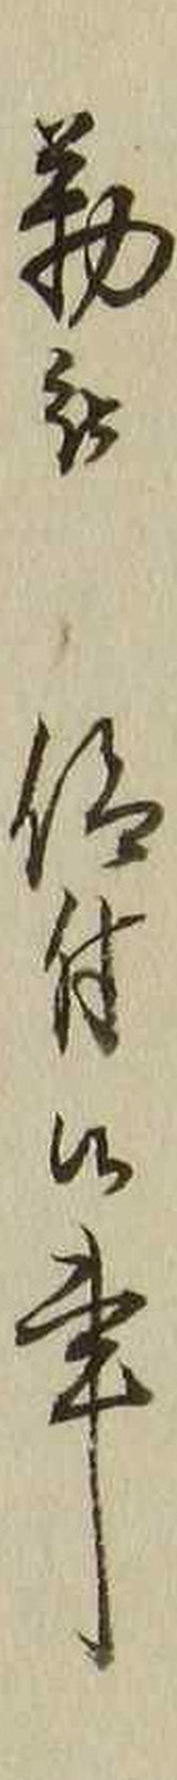勤被仰付候事
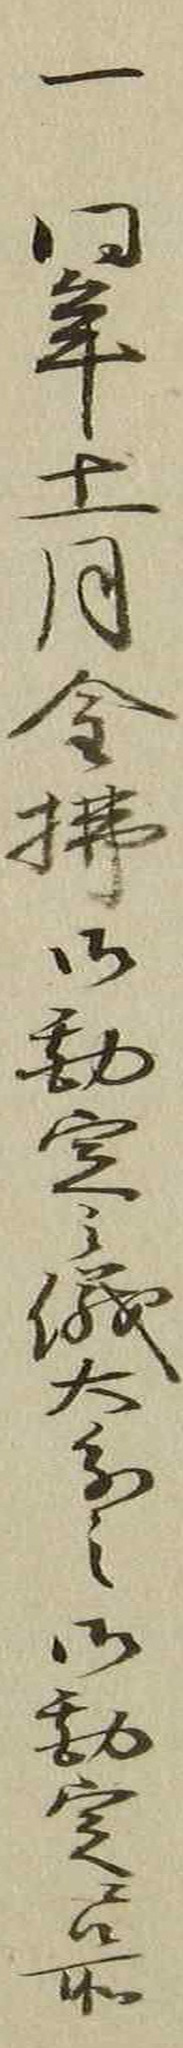一同年十一月金払御勘定之儀大分之御勘定ニ候所
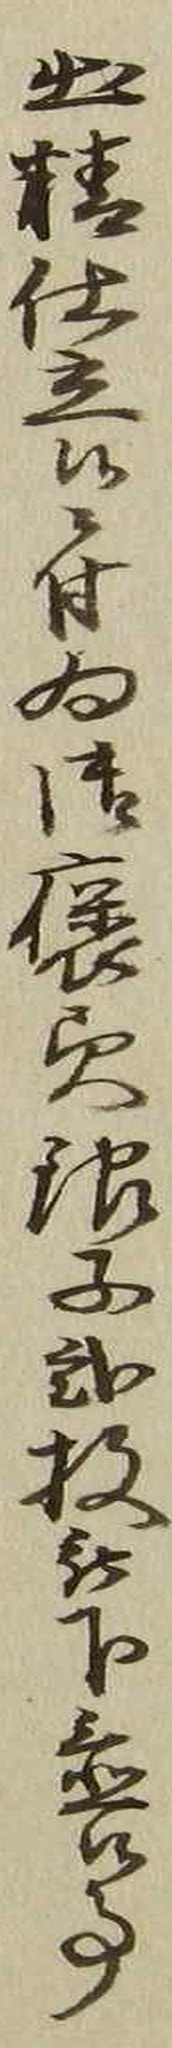出精仕立候ニ付ゐ御褒美銀子弐枚被下置候事
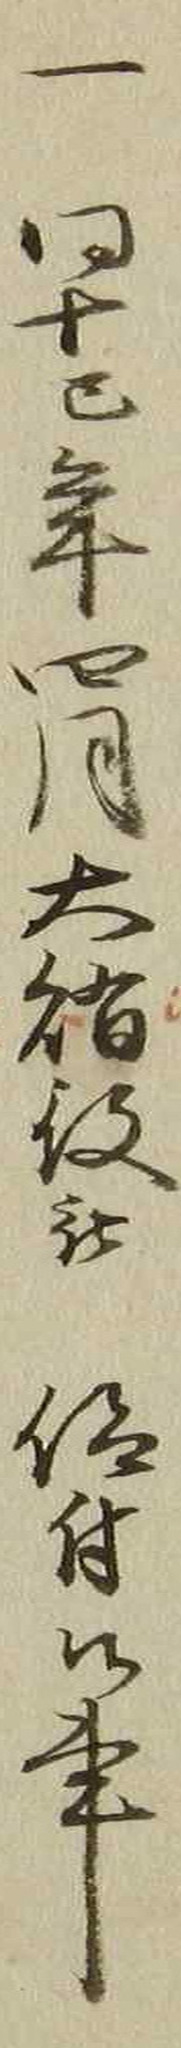一同十巳年四月大賄役被仰付候事
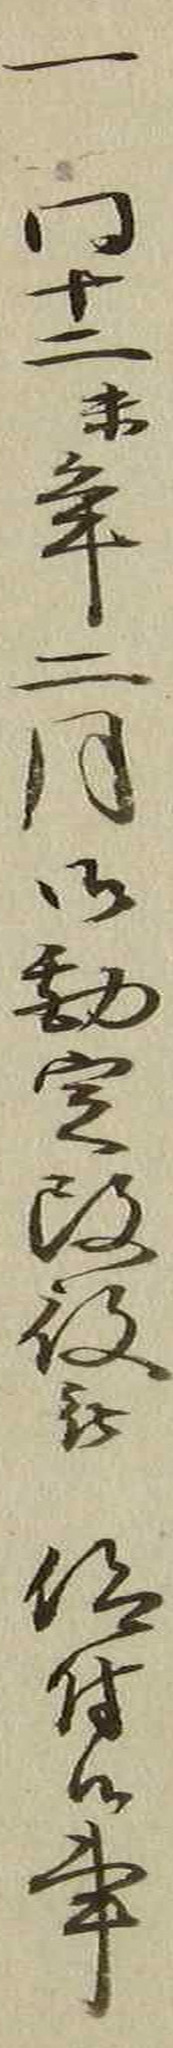一同十二未年二月御勘定改役被仰付候事
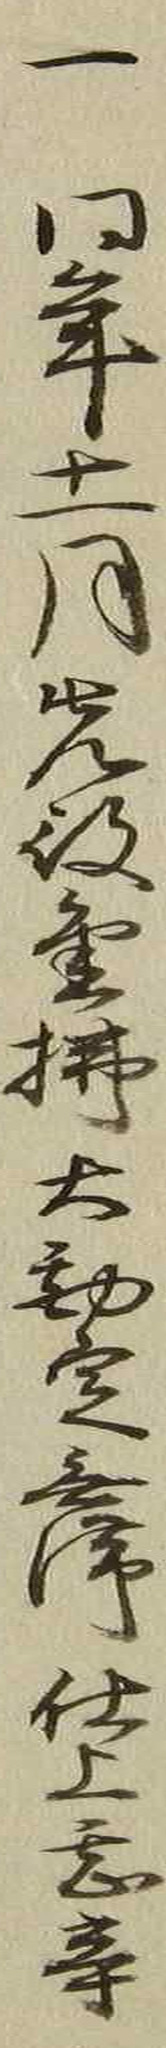一同年十一月先役金払大勘定無滞仕上甚辛
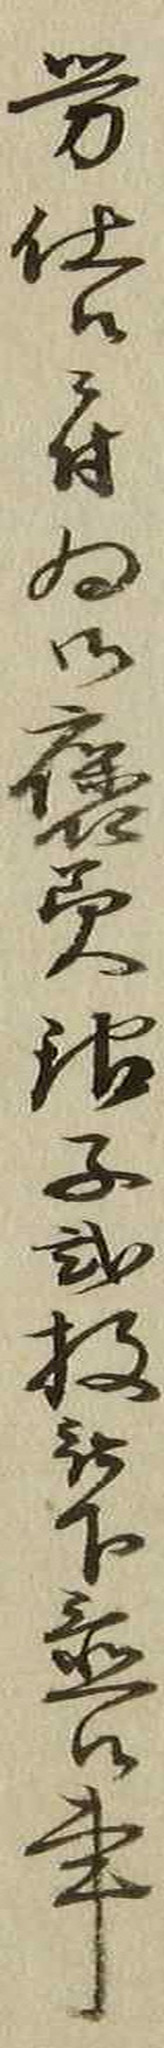労仕候ニ付ゐ御褒美銀子弐枚被下置候事
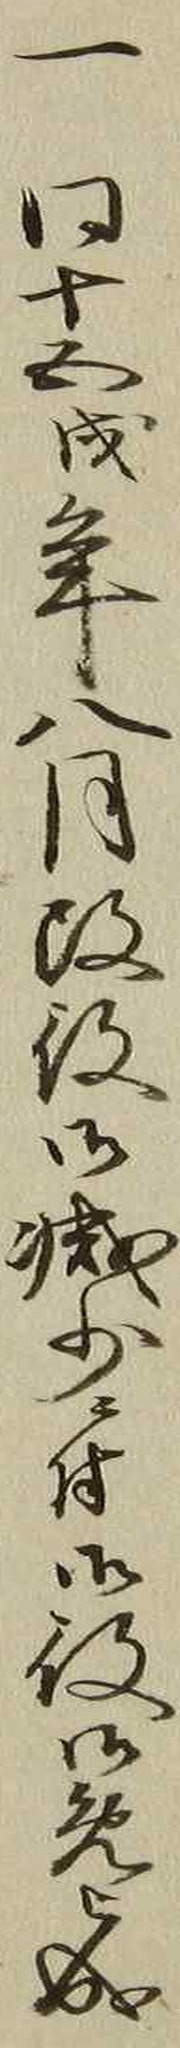一同十五戌年八月改役御減少ニ付御役御免被成
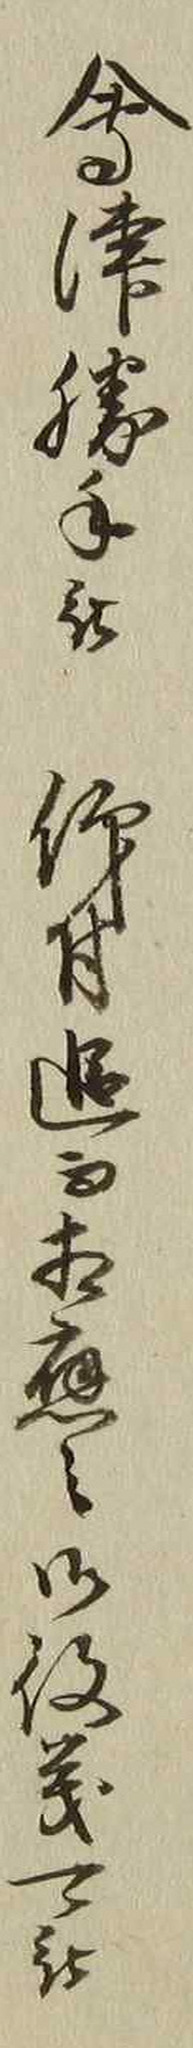会津勝手被仰付追而相応之御役義可被
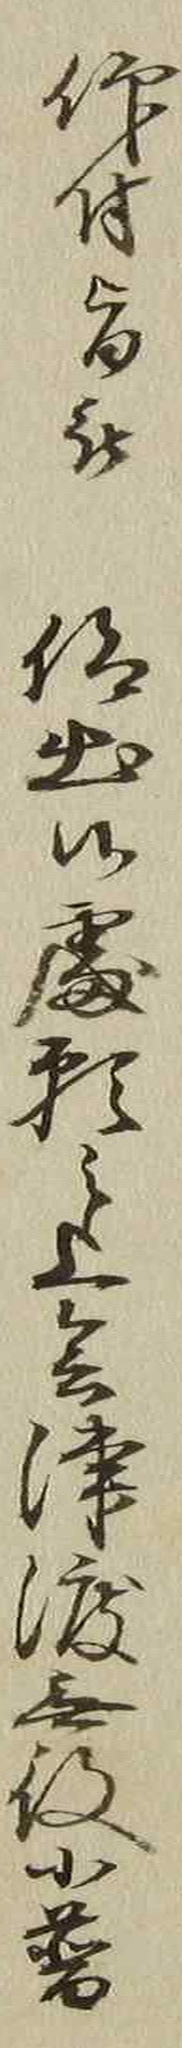仰付旨被仰出候處願之上会津渡無役小普
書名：諸士系譜　巻之114　か之部22
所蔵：会津若松市立会津図書館
